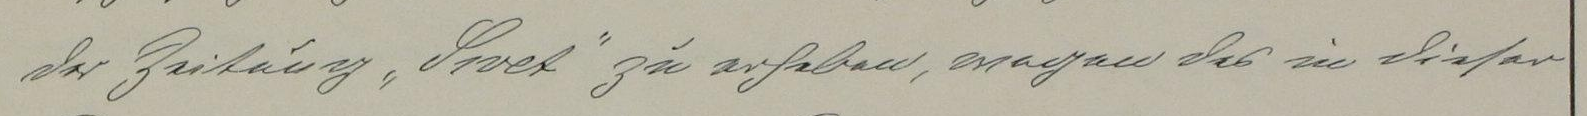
der Zeitung „Swet“ zu erheben, wegen des in dieser
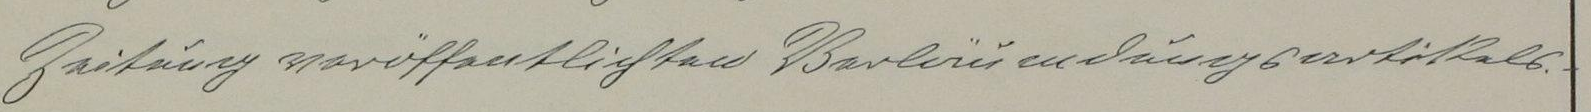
Zeitung veröffentlichten Verläumdungsartikels.
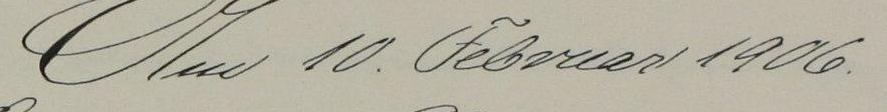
Am 10. Februar 1906.
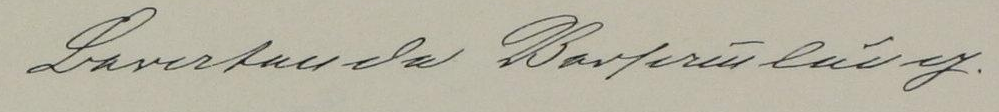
Beratende Versammlung
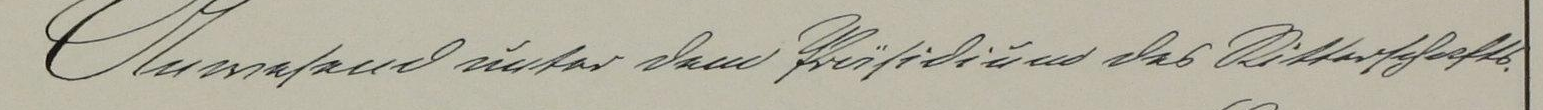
Anwesend unter dem Präsidium des Ritterschafts-
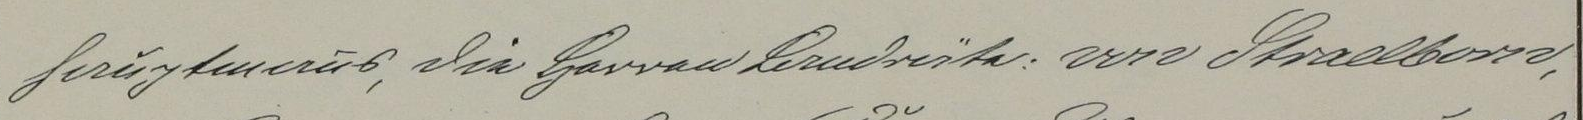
hauptmanns, die Herren Landräte: von Straelborn,
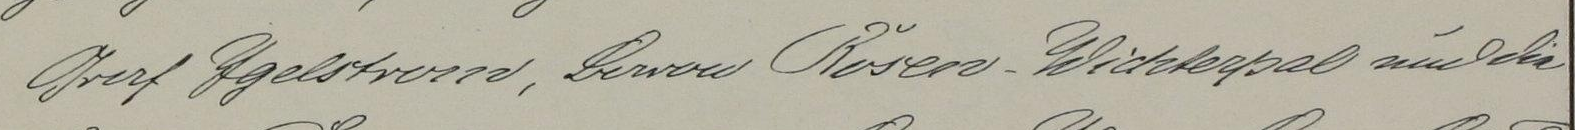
Graf Igelstrom, Baron Rosen-Wichterpal und die
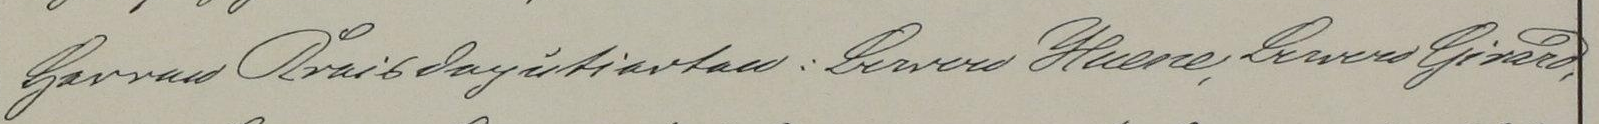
Herren Kreisdeputierten: Baron Huene, Baron Girard,
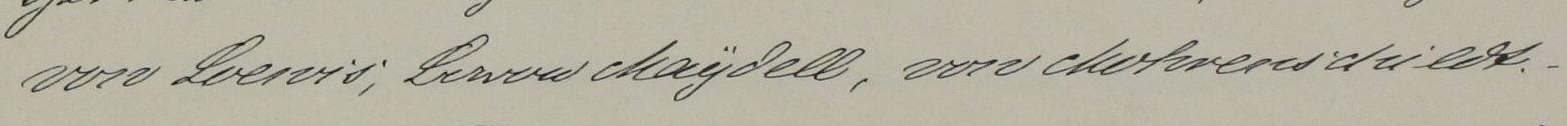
von Loewis, Baron Maydell, von Mohrenschildt.
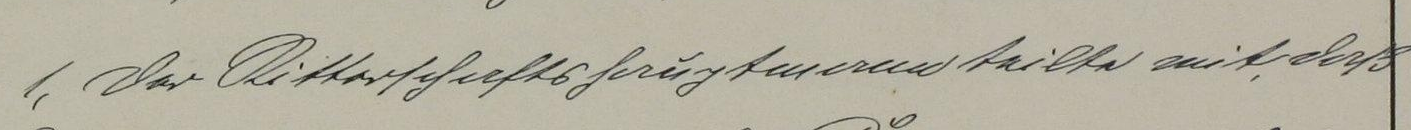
1. Der Ritterschaftshauptmann teilte mit, daß
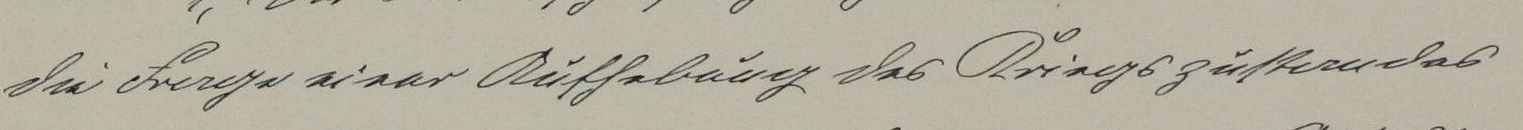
die Frage einer Aufhebung des Kriegszustandes
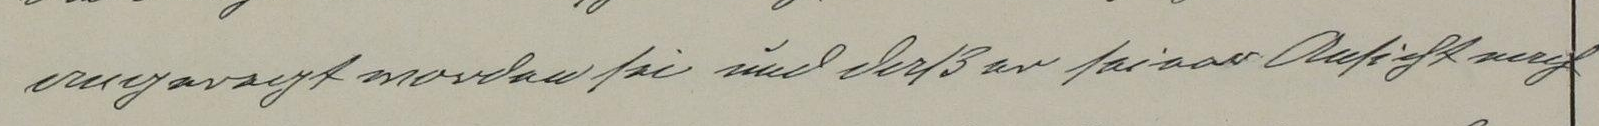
angeregt worden sei und daß er seiner Ansicht nach
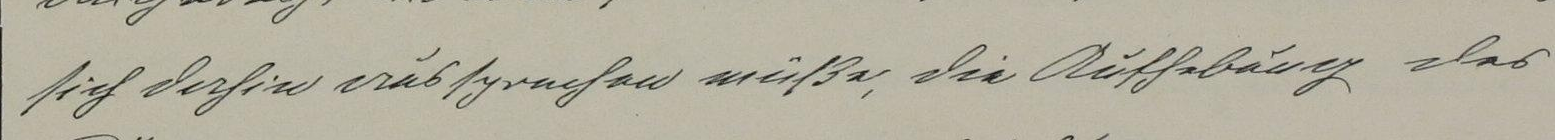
sich dahin aussprechen müße, die Aufhebung des
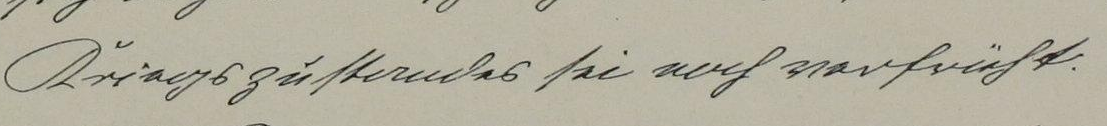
Kriegszustandes sei noch verfrüht.
